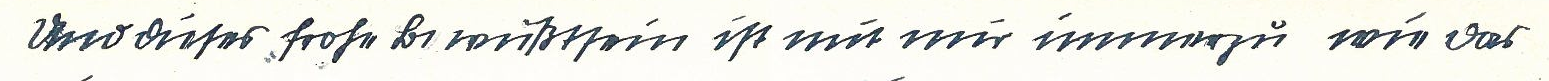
Und dieses frohe Bewußtsein ist mit mir immerzu wie das
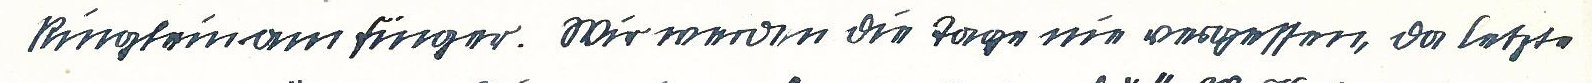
Ringlein am Finger. Wir werden die Tage nie vergessen, da letzte
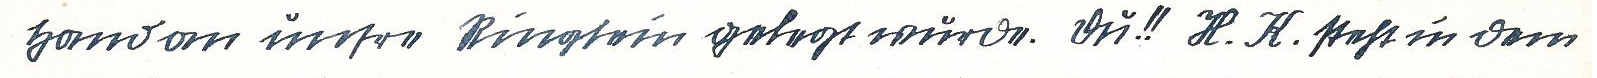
Hand an unsre Ringlein gelegt wurde. Du!! steht in dem
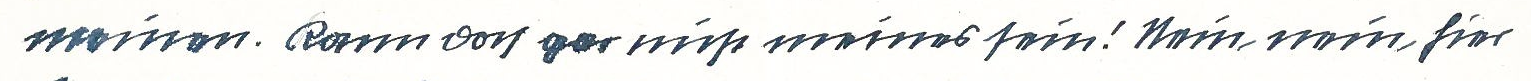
meinen. Kann doch gar nicht meines sein! Nein, nein, hier
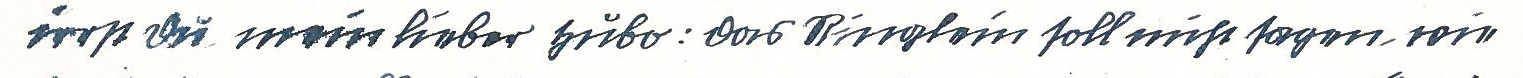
irrst Du, mein lieber Hubo: Das Ringlein soll nicht sagen, wie
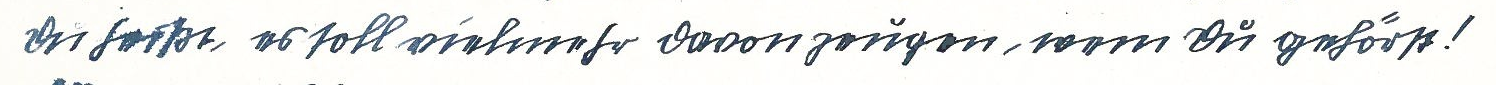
Du heißt, es soll vielmehr davon zeugen, wem Du gehörst!
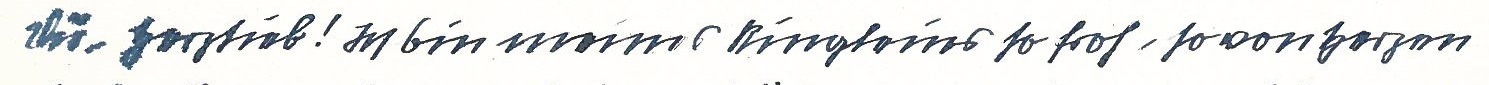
Du, Herzlieb! Ich bin meines Ringleins so froh, so von Herzen
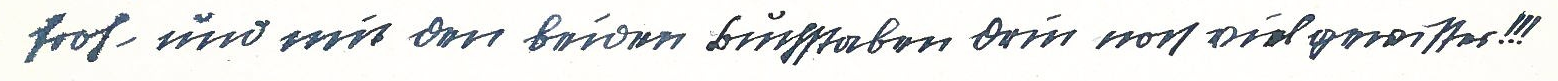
froh, und mit den beiden Buchstaben drin noch viel gewisser!!!
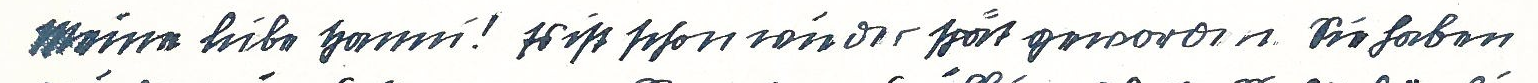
Meine liebe ! Es ist schon wieder spät geworden. Sie haben
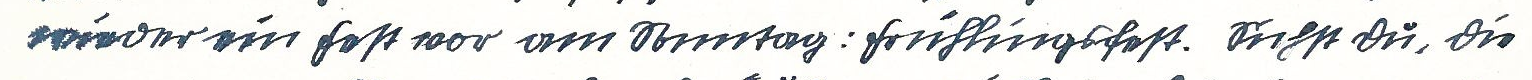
wieder ein Fest vor am Sonntag: Frühlingsfest. Siehst Du, die
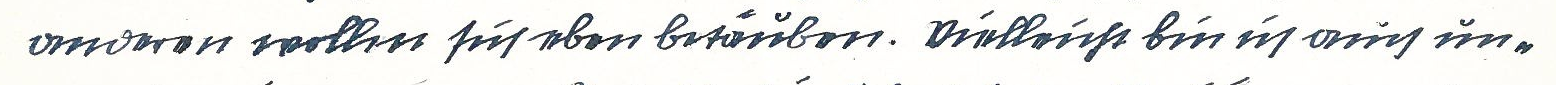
anderen wollen sich eben betäuben. Vielleicht bin ich auch un¬
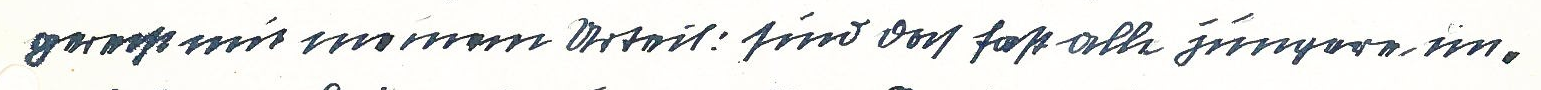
gerecht mit meinem Urteil: sind doch alle jüngere, un¬
